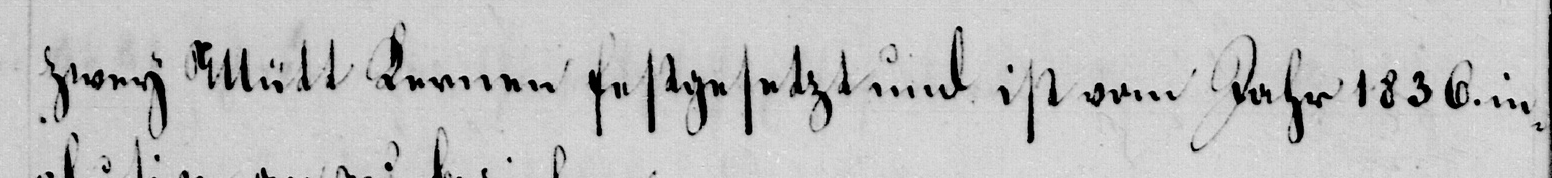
zwey Mütt Kernen festgesetzt und ist vom Jahr 1836. in¬
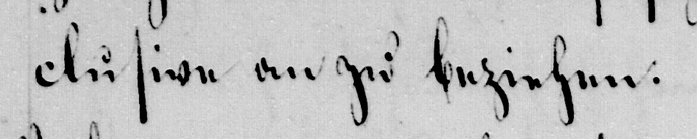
clusive an zu beziehen.
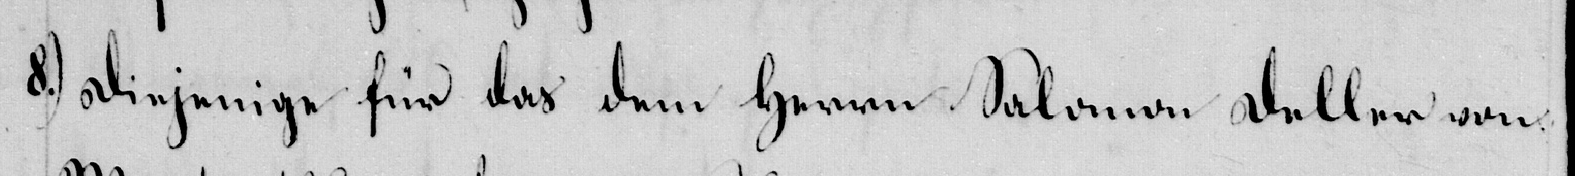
Diejenige für das dem Herrn Salomon Deller von
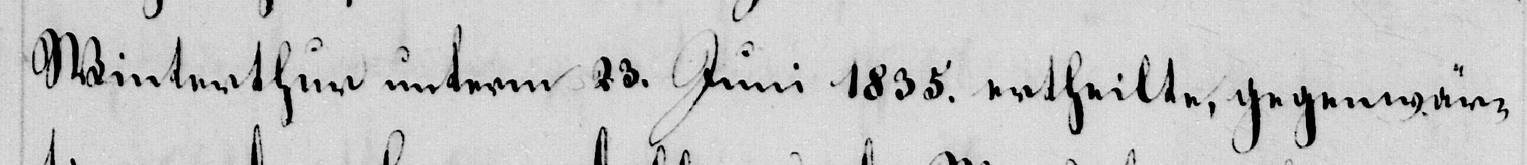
Winterthur unterm 23. Juni 1835. ertheilte, gegenwär¬
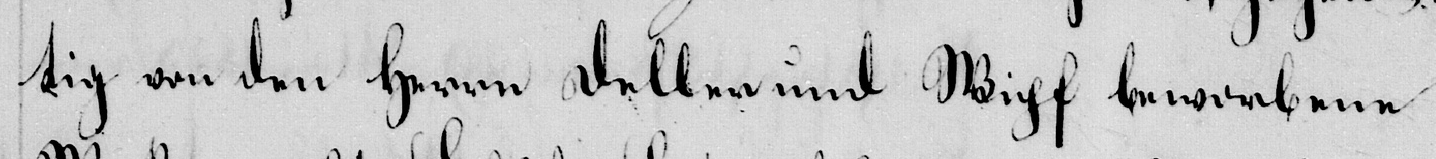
tig von den Herrn Deller und Wipf beworbene
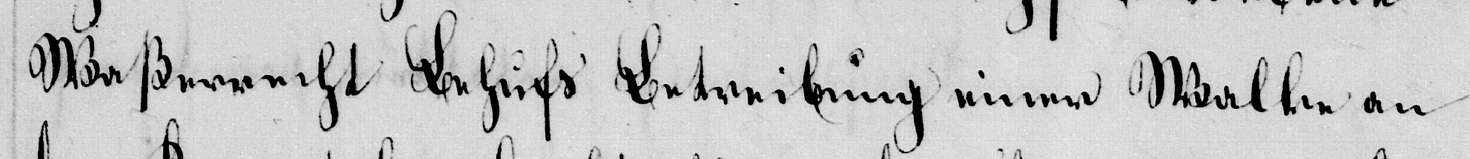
Waßerrecht Behufs Betreibung einer Walke an
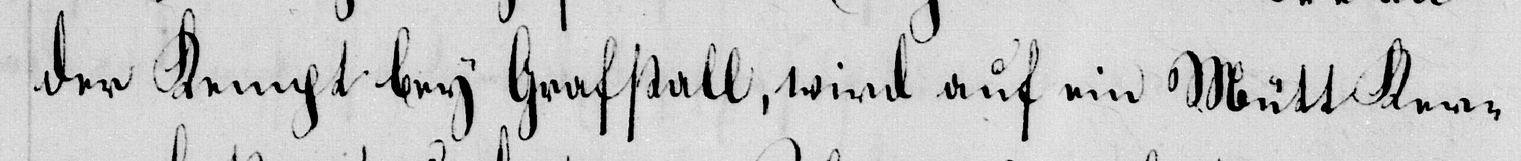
der Kempt bey Grafstall, wird auf ein Mütt Ker¬
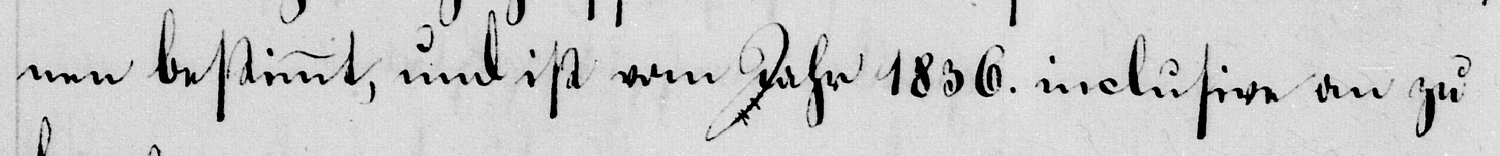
nen bestimmt, und ist vom Jahr 1836. inclusive an zu
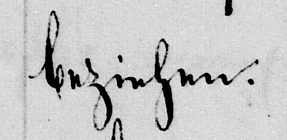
beziehen.
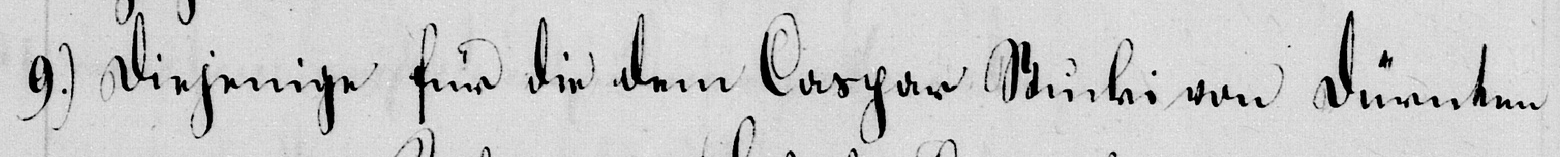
9.) Diejenige für die dem Caspar Stucki von Dürnten
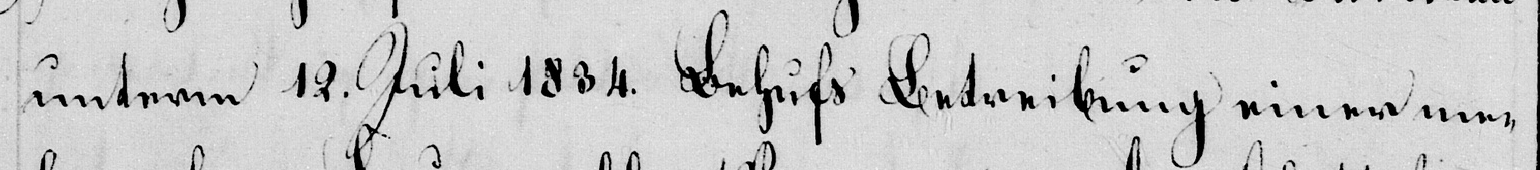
untern 12. Juli 1834. Behufs Betreibung einer me¬
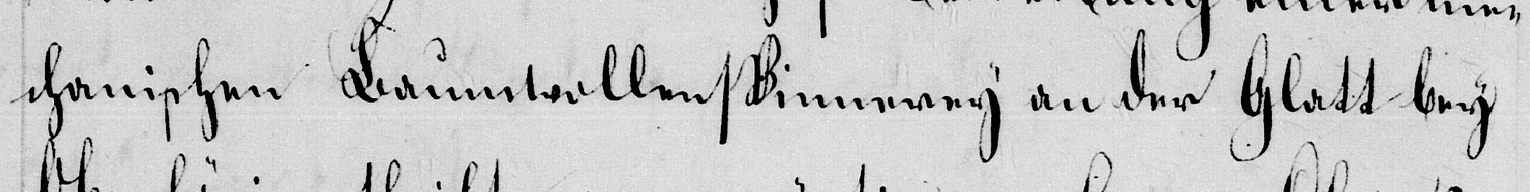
chanischen Baumwollenspinnerey an der Glatt bey
